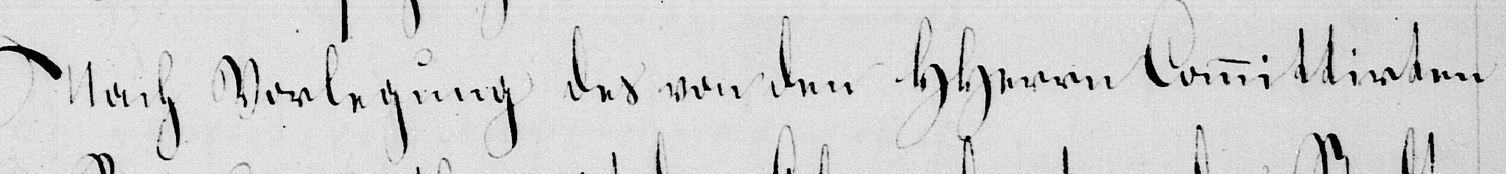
Nach Vorlegung des von den HHerren Committirten
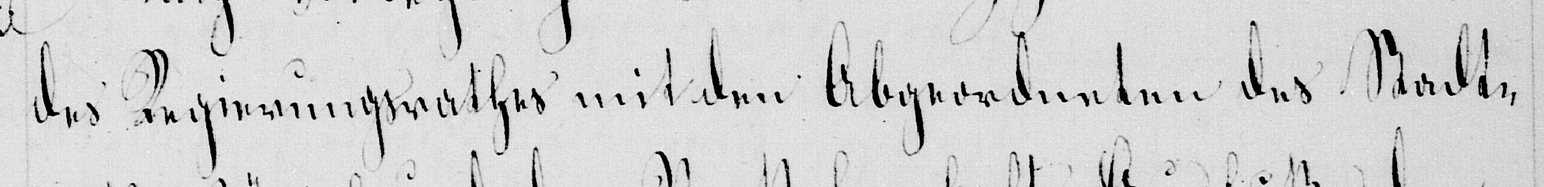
des Regierungsrathes mit den Abgeordneten des Stadt¬
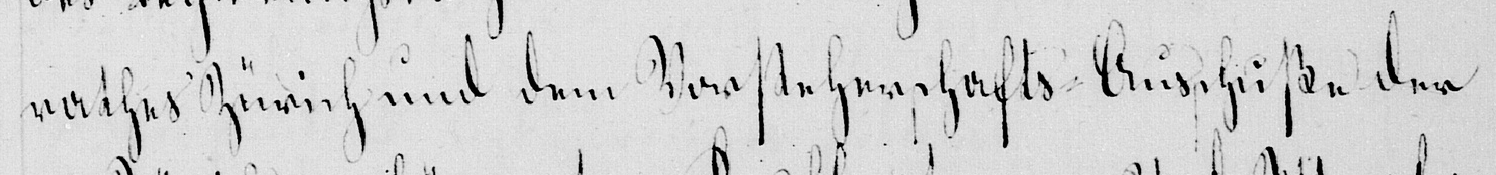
rathes Zürich und dem Vorsteherschafts-Ausschuße der
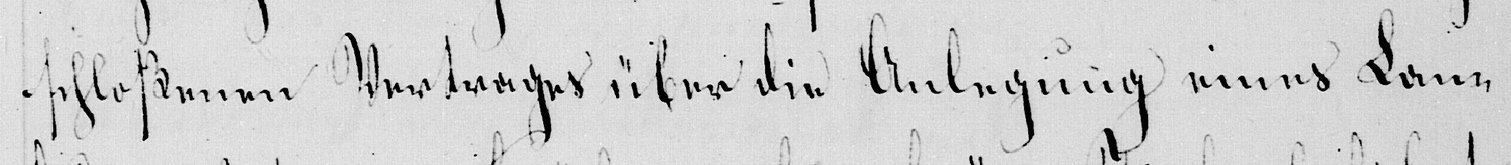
schloßenen Vertrages über die Anlegung eines Lan¬
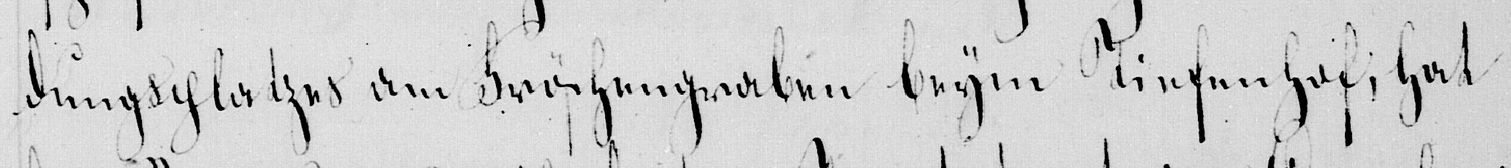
dungsplatzes am Fröschengraben beym Tiefenhof, hat
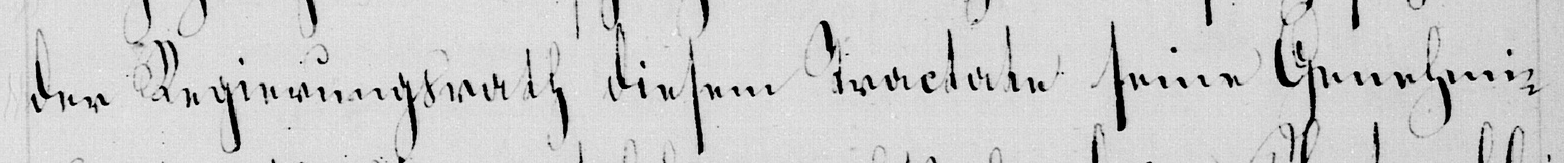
der Regierungsrath diesem Tractate seine Genehmi¬
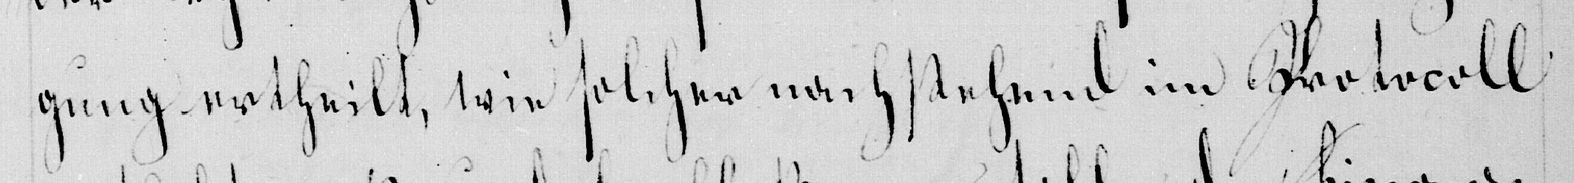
gung ertheilt, wie solcher nachstehend im Protocoll
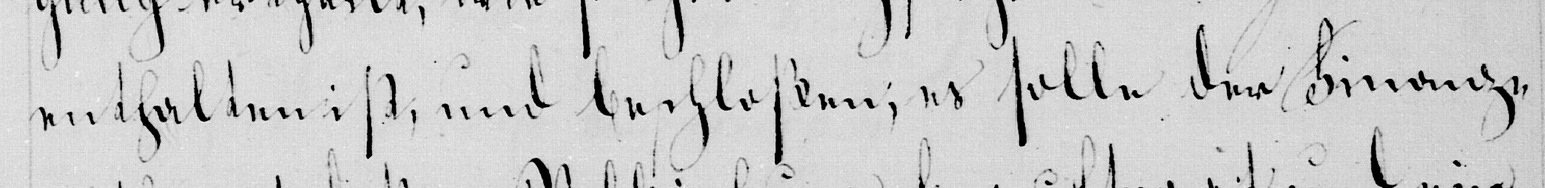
enthalten ist, und beschloßen, es solle der Finanz¬
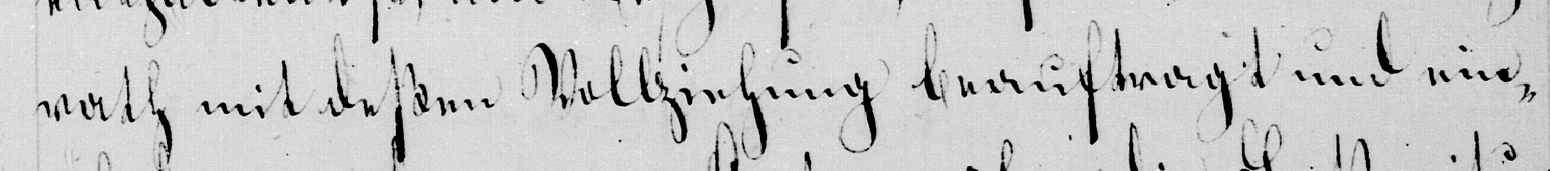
rath mit deßen Vollziehung beauftragt und ein¬
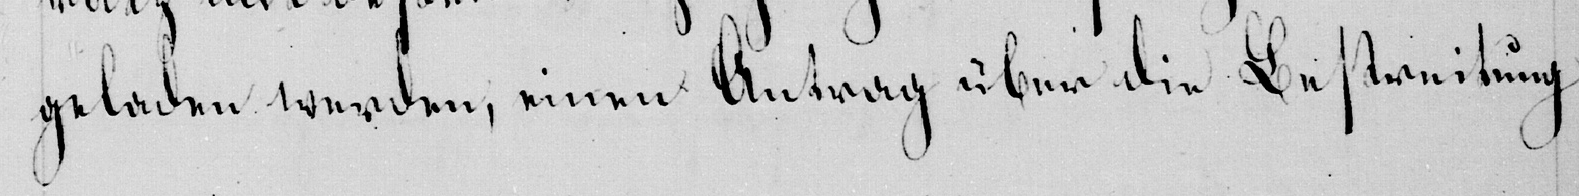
geladen werden, einen Antrag über die Bestreitung
